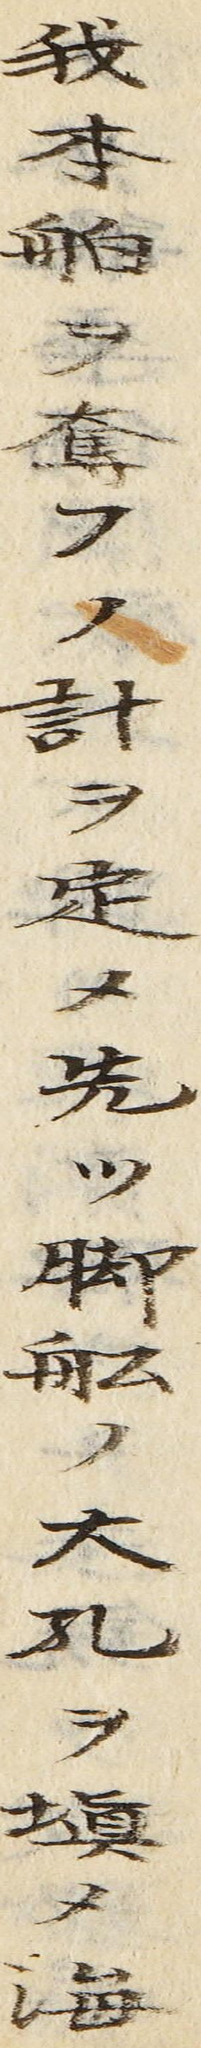我本舶ヲ奪フノ計ヲ定メ先ツ脚船ノ大孔ヲ填メ海
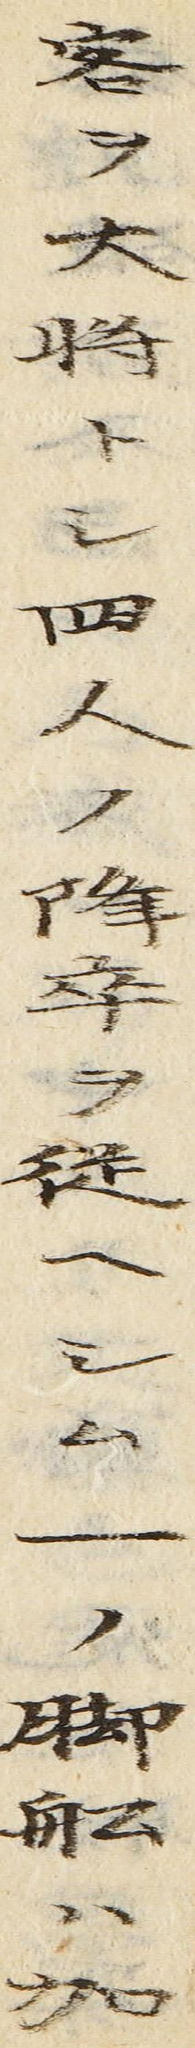客ヲ大将トシ四人ノ降卒ヲ従ヘシム一ノ脚船ハ加
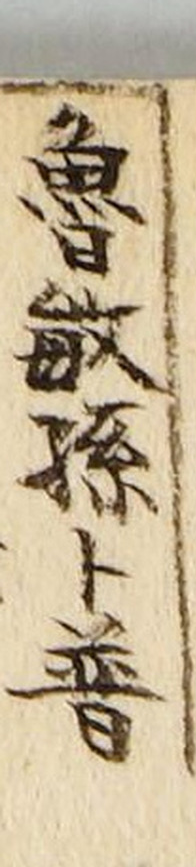魯敏孫ト普
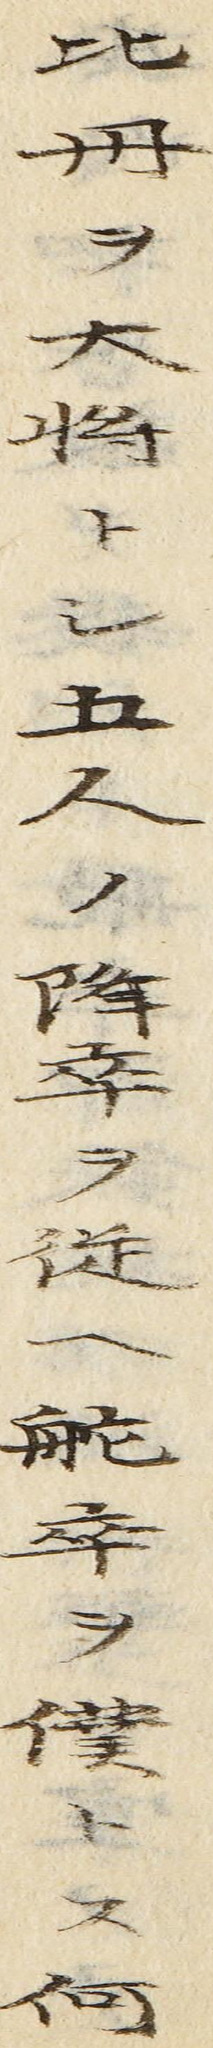比丹ヲ大将トシ五人ノ降卒ヲ従ヘ舵卒ヲ僕トス何
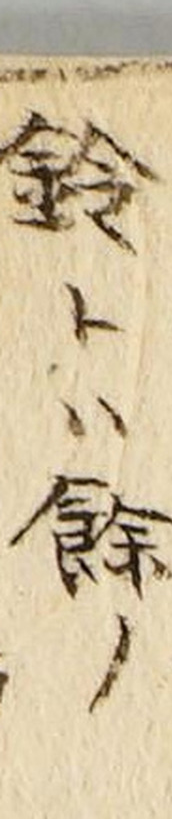鈴トハ余ノ
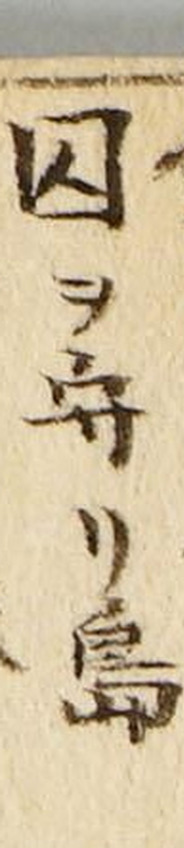囚ヲ守リ島
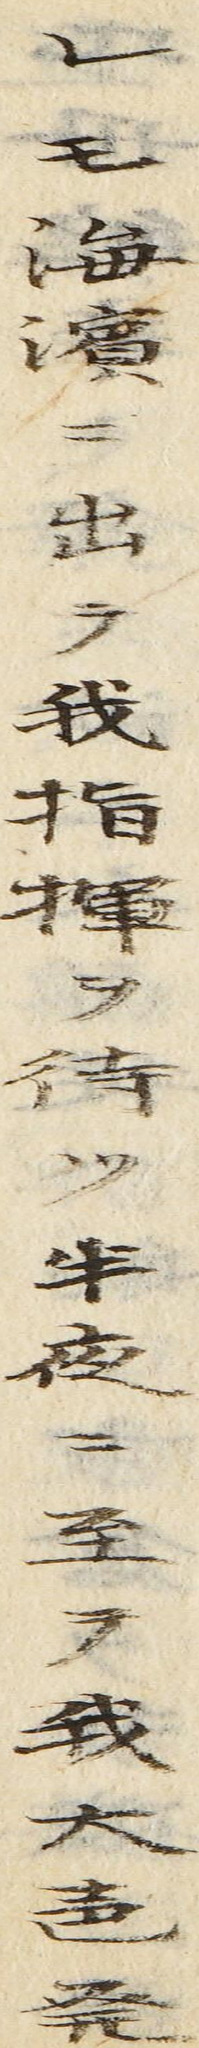レモ海浜ニ出テ我指揮ヲ待ツ半夜ニ至テ我大声発
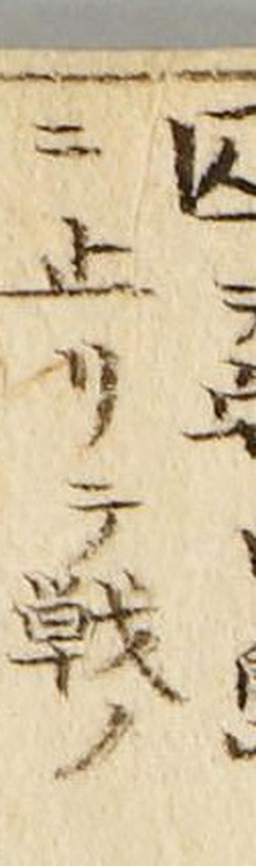ニ止リテ戦ノ
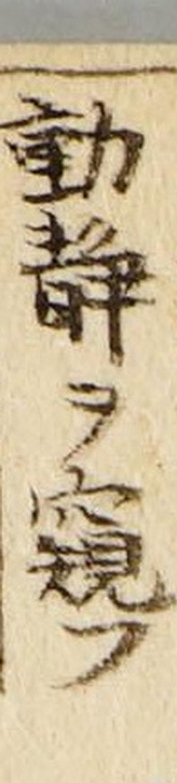動静ヲ窺フ
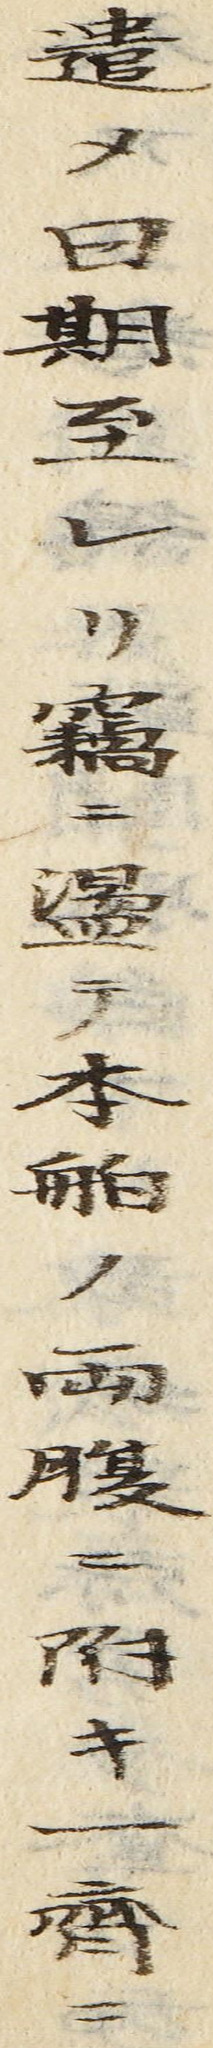遣シテ曰期至レリ竊ニ盪テ本舶ノ両腹ニ附キ一斉ニ
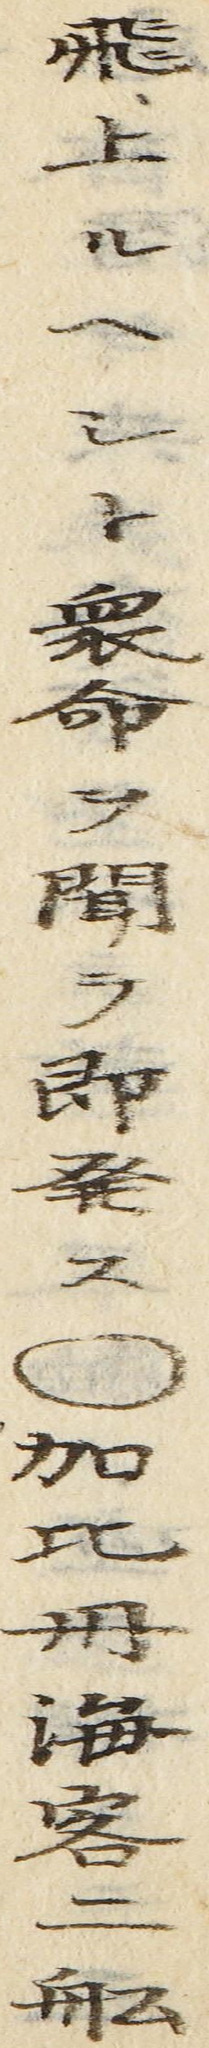飛上ルヘシト衆命ヲ聞テ即発ス◯加比丹海客二船
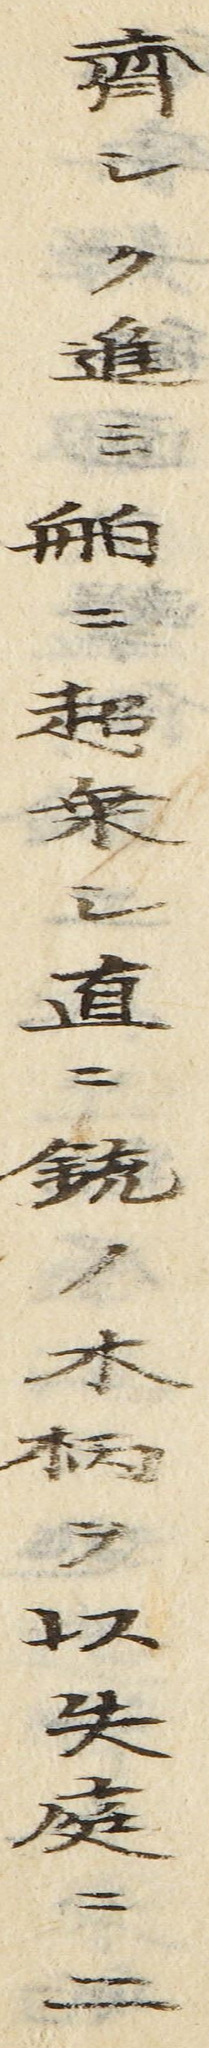斉シク進ミ舶ニ超乗シ直ニ銃ノ木柄ヲ以失庭ニ二

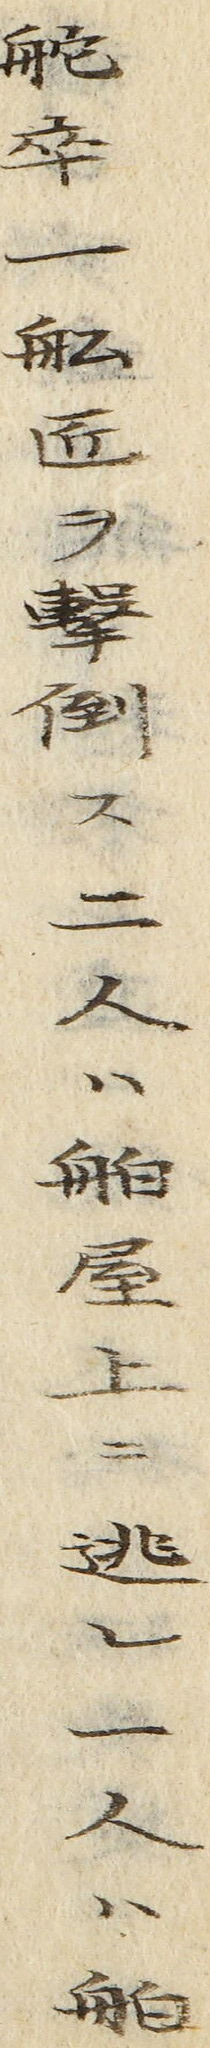舵卒一船匠ヲ撃倒ス二人ハ舶屋上ニ逃レ一人ハ舶
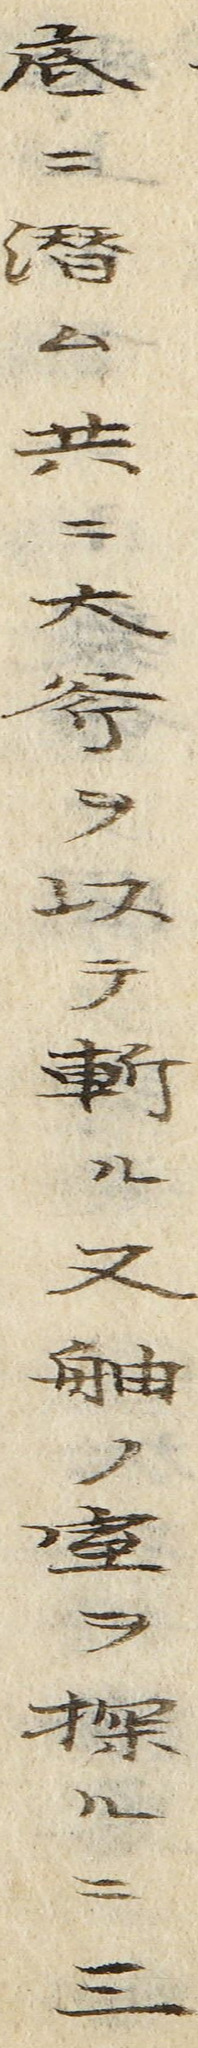底ニ潜ム共ニ大斧ヲ以テ斬ル又舳ノ室ヲ探ルニ三
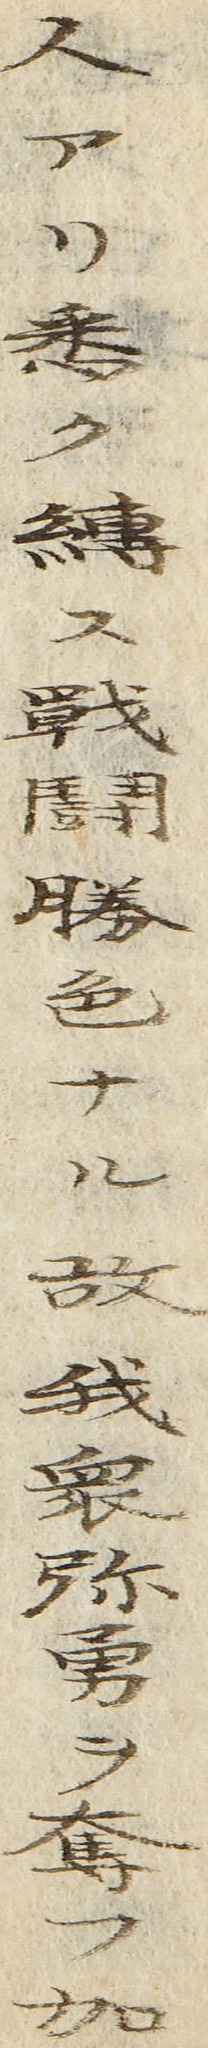人アリ悉ク縛ス戦闘勝色ナル故我衆弥勇ヲ奪フ加
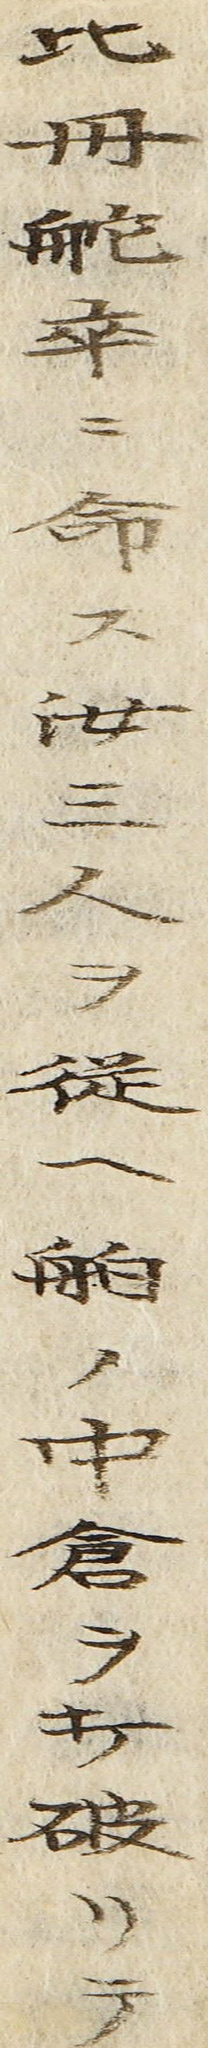比丹舵卒ニ命ス汝三人ヲ従ヘ舶ノ中倉ヲ打破リテ
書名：漂流紀事
